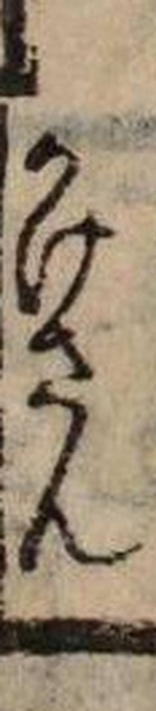かけさん
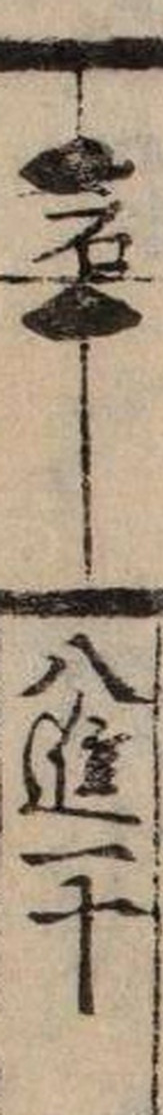六石八進一十斗

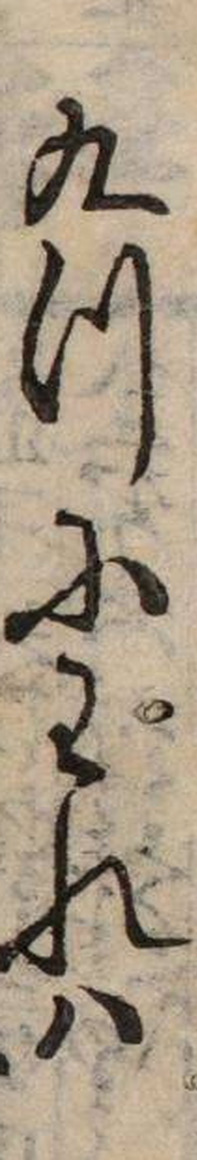九つにわれは
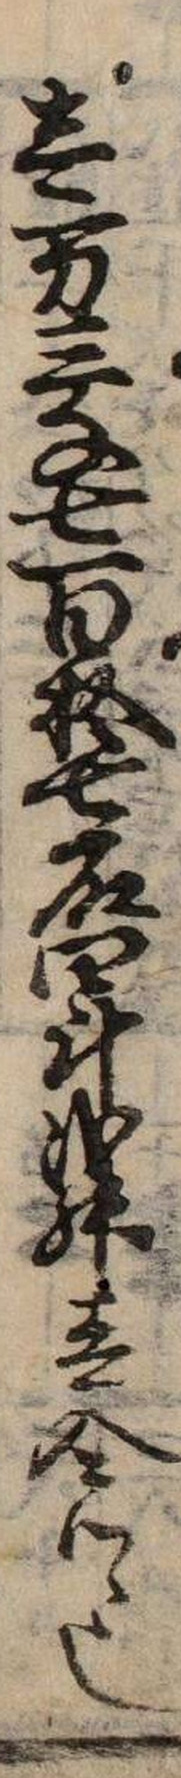壱万三千七百十拾七石四斗弍升壱合つゝ也
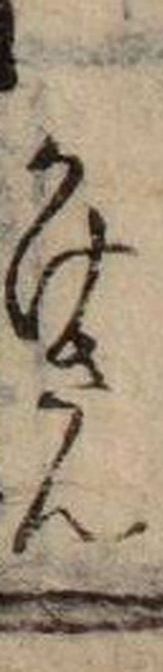かけさん
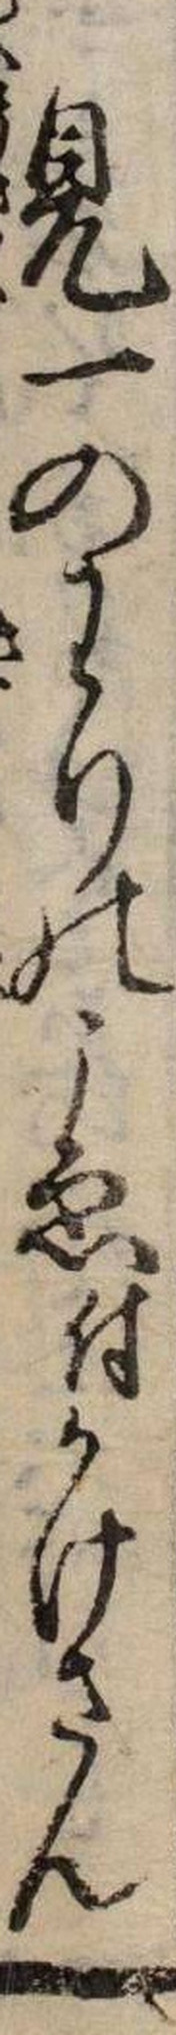第八見一のわりのこゑ付かけさん
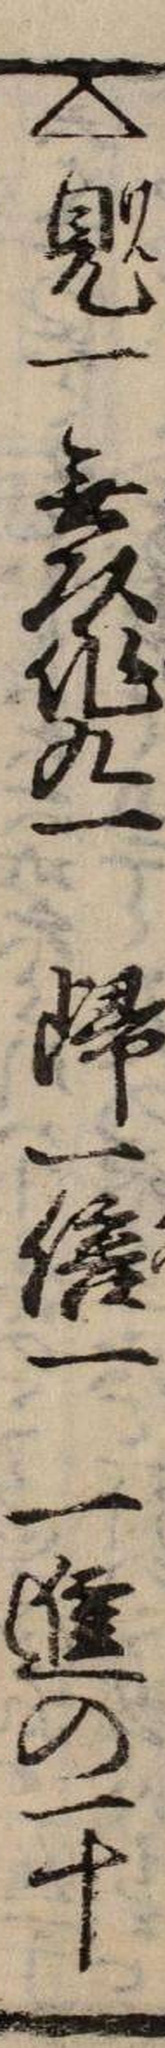△見一無頭作九一帰一倍一一進一十
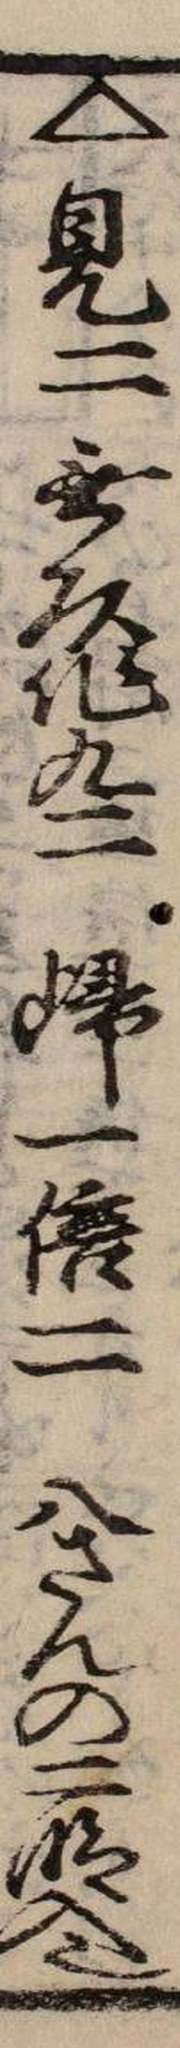△見二無頭作九二帰一倍二八さんの二段入也
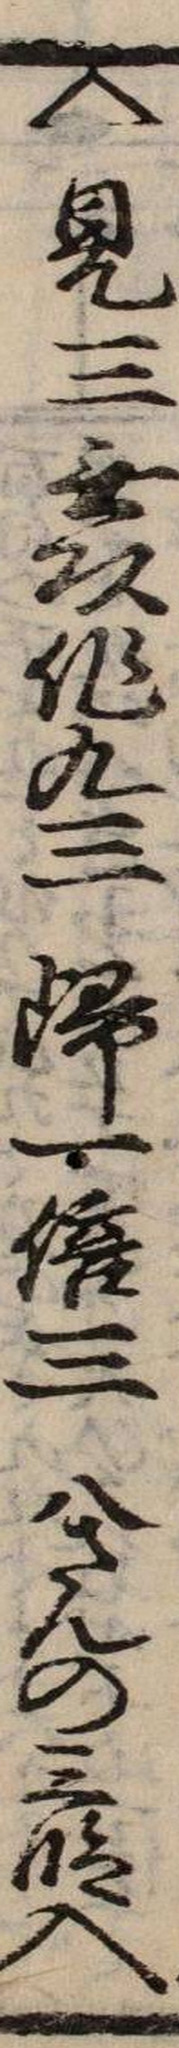△見三無頭作九一帰一倍三八さんの三段入
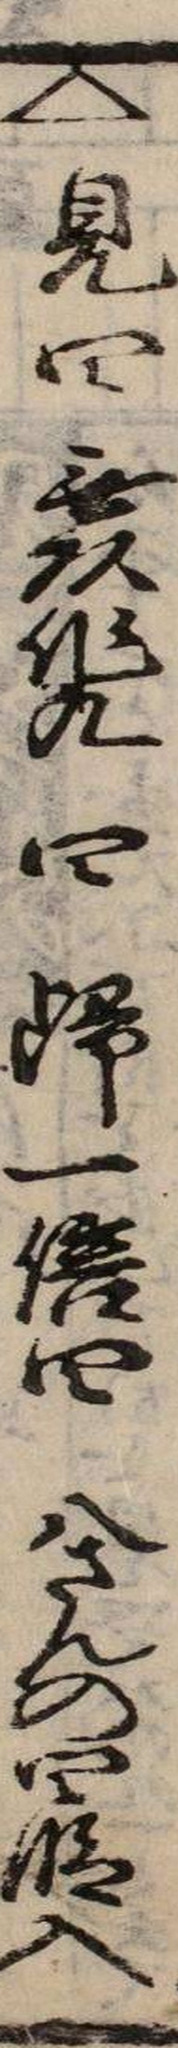△見四無頭作九四帰一倍四八さんの四段入
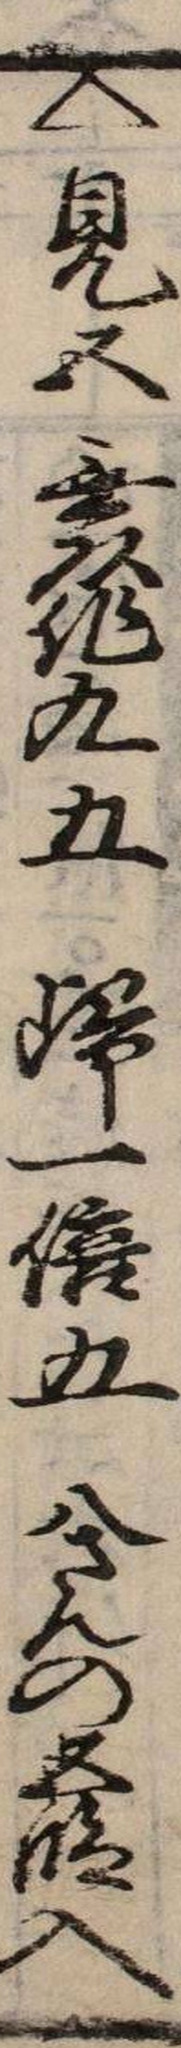△見五無頭作九五帰一倍五八さんの五段入
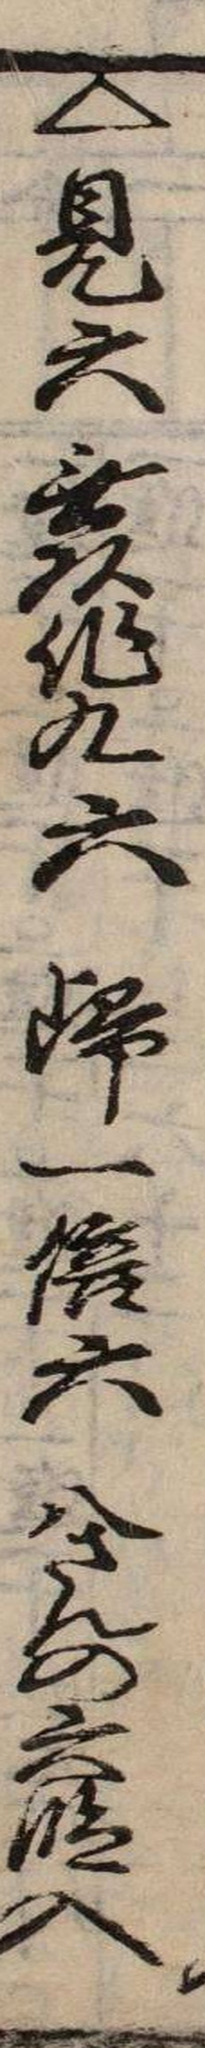△見六無頭作九六帰一倍六八さんの六段入
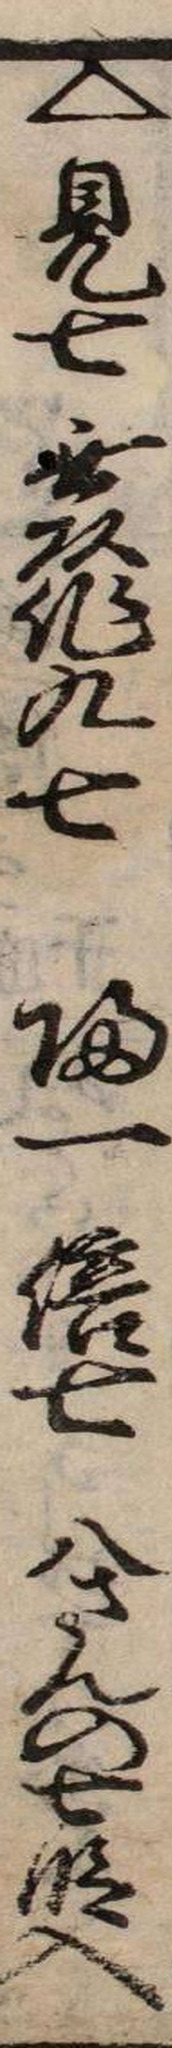△見七無頭作九七帰一倍七八さんの七段入
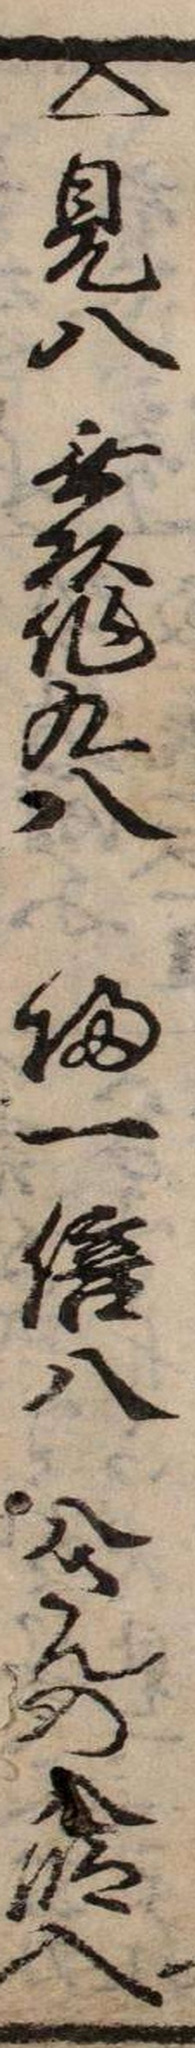△見八無頭作九八帰一倍八八さんの八段入
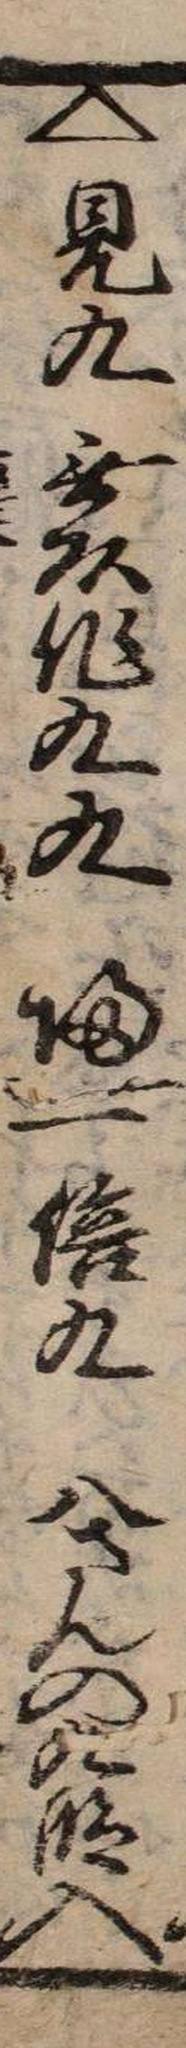△見九無頭作九九帰一倍九八さんの九段入

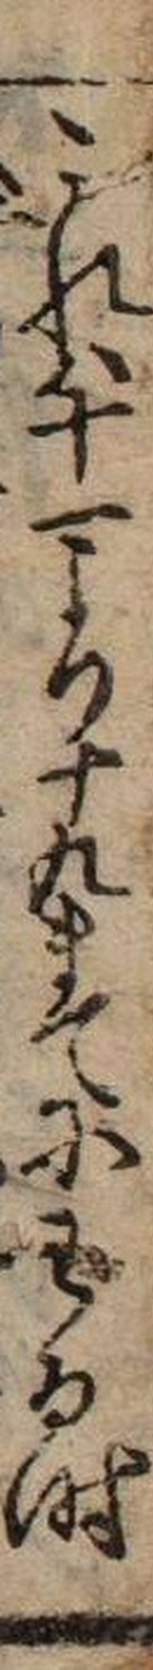これは十一より十九まてにわる時
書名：塵劫記（寛永11年自跋、京都府立京都学・歴彩館追貴8）
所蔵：京都府立京都学・歴彩館 国文学研究資料館
